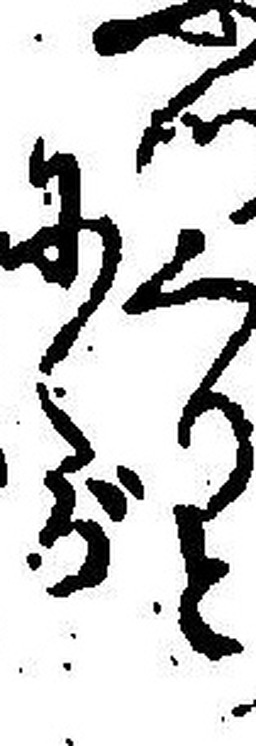にくが
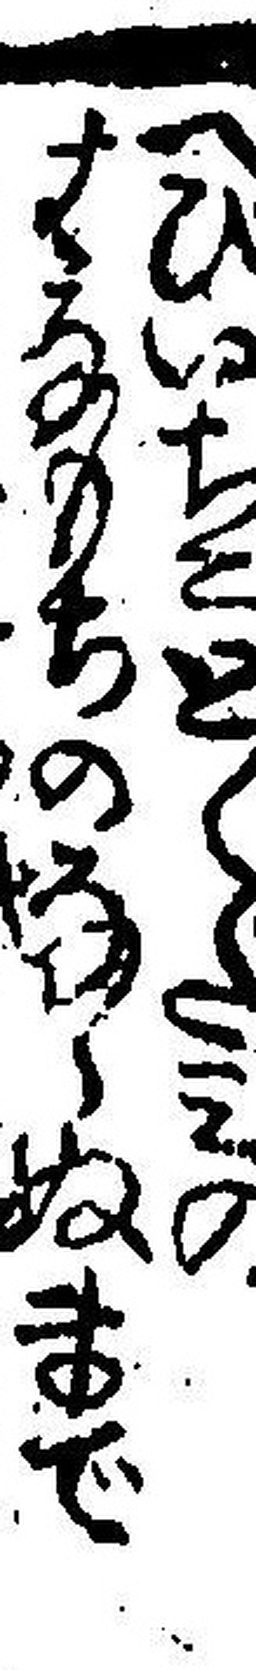はなもちのならぬまで
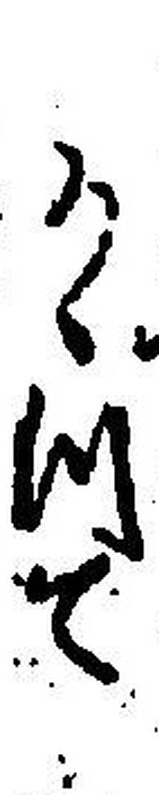かゝつて
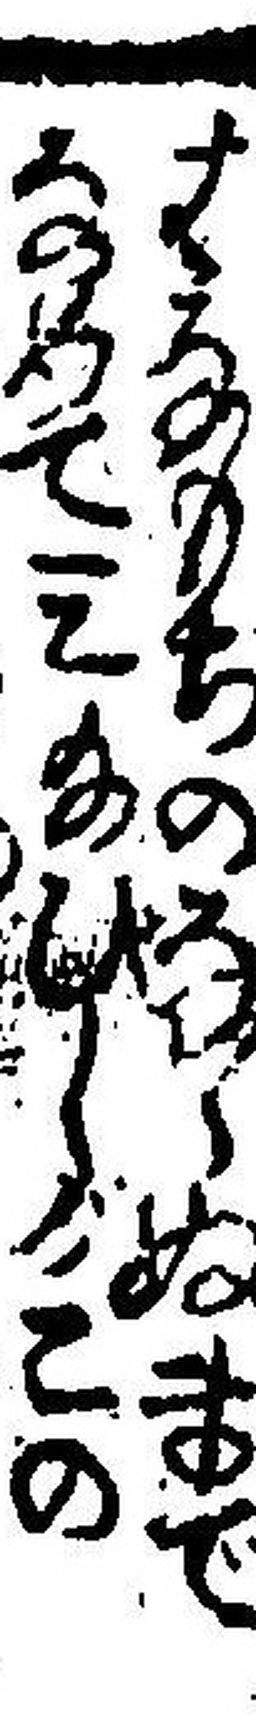なめてみ給ひしかこの
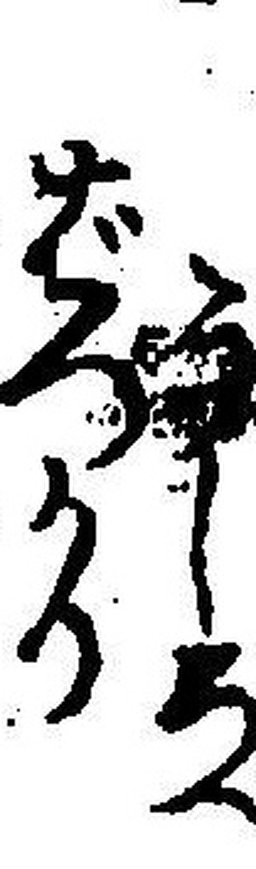ばつかり
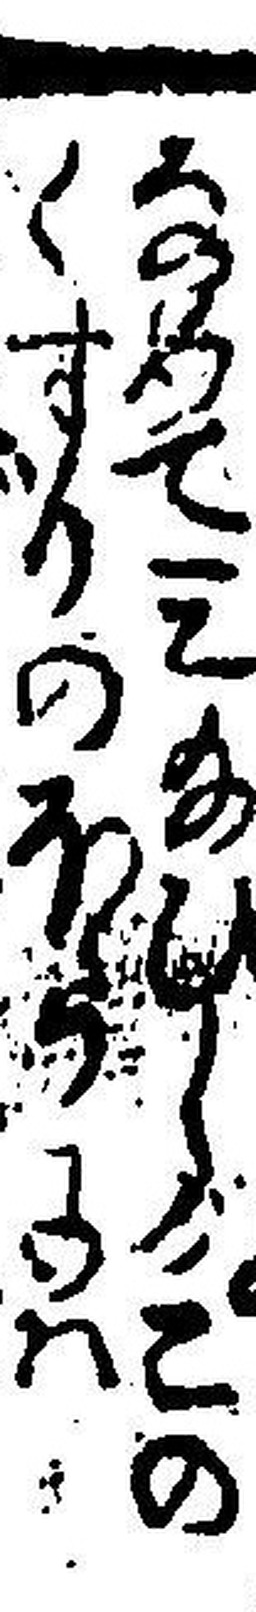くすりのほうには
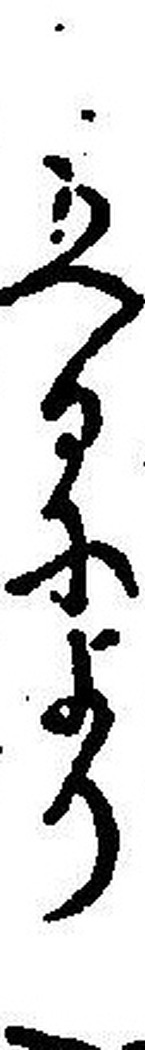かへるにより
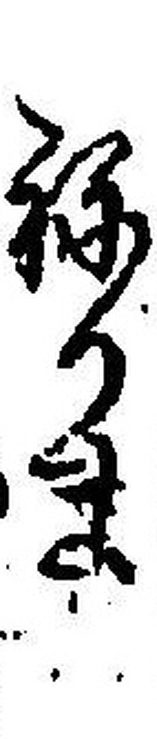ねりま
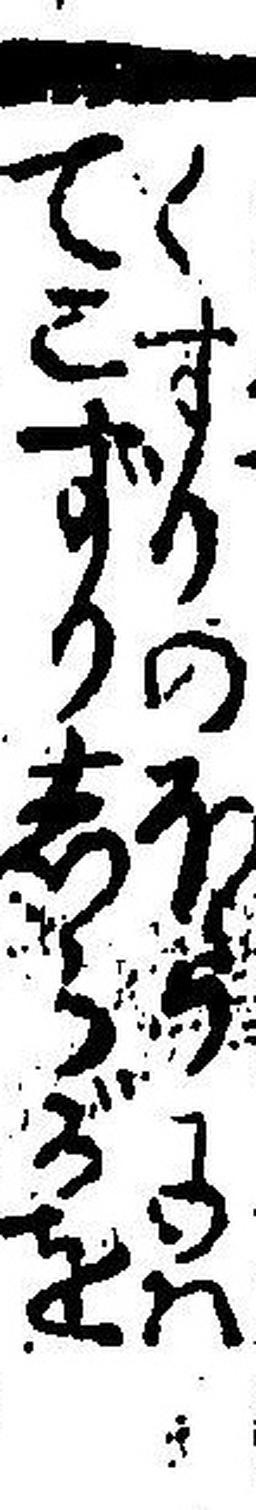てこずりしらがを
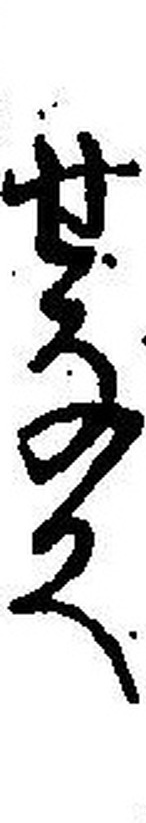せなかへ
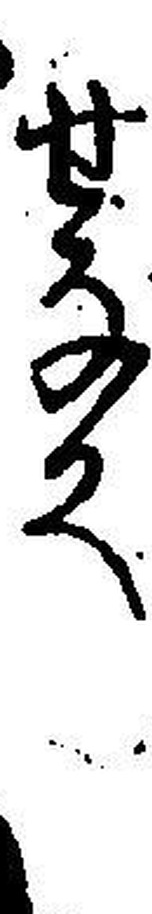せなかへ
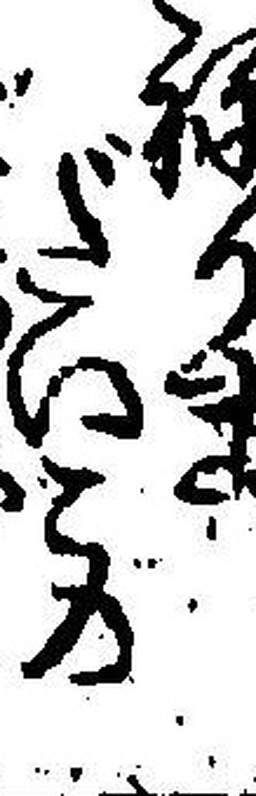だいこの
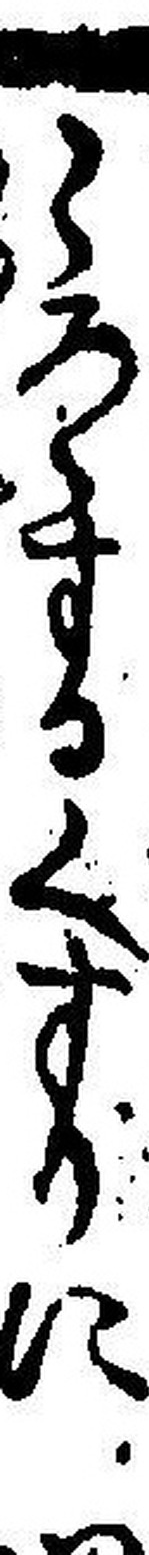くろくするくすりに
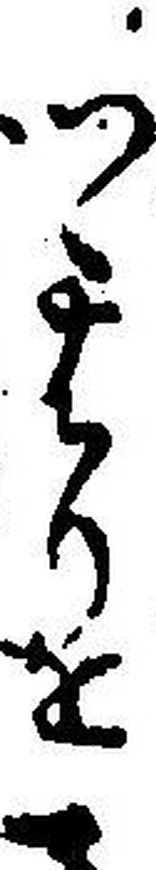つゝはりを
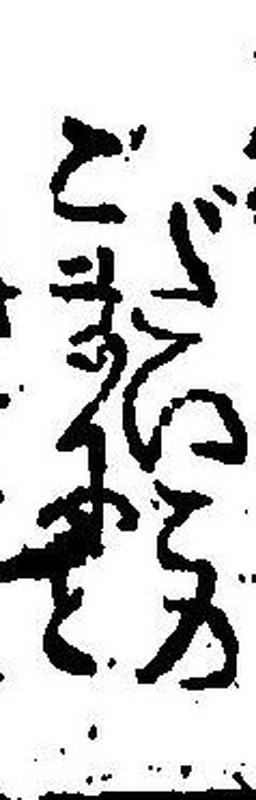ごまにと
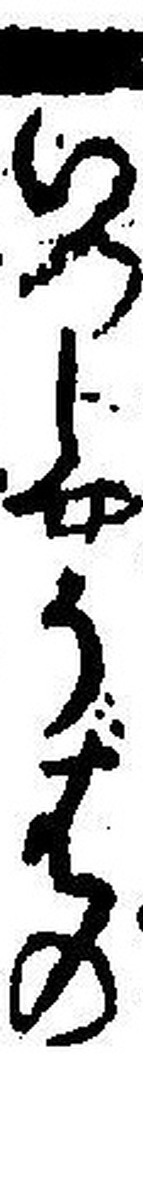いつしやうはの
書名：徳若水縁起金性 / 樹下石上作
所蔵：東京大学総合図書館 General Library in the University of Tokyo, JAPAN
